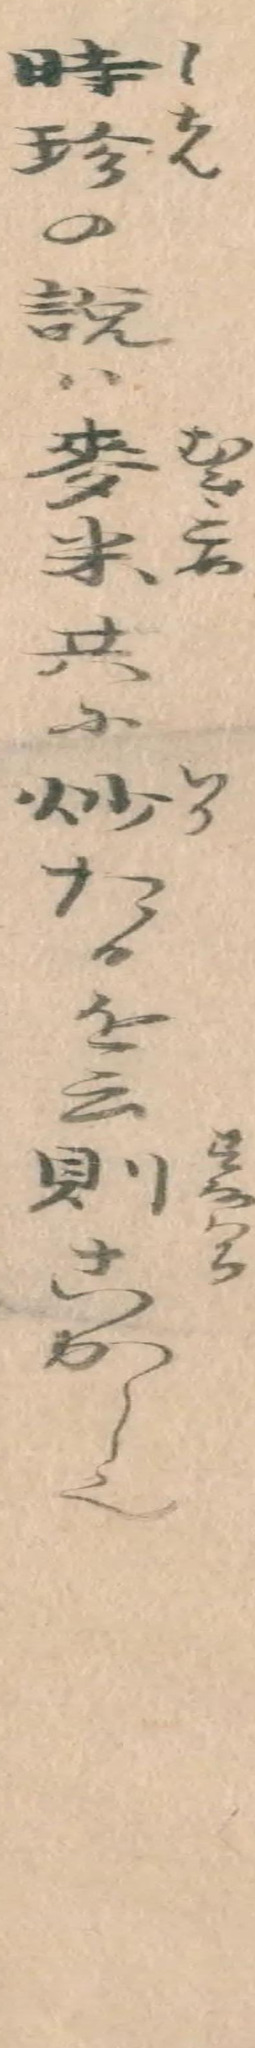時珍の説は麦米共に炒たるを云則こかし也
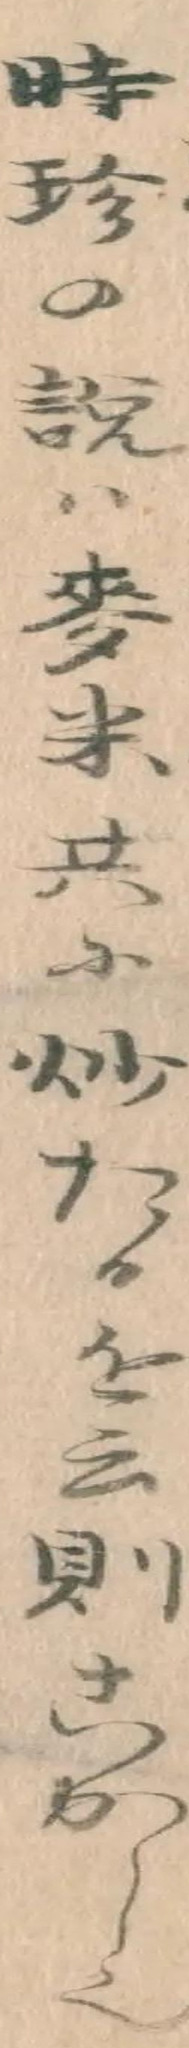時珍の説は麦米共に炒たるを云則こかし也
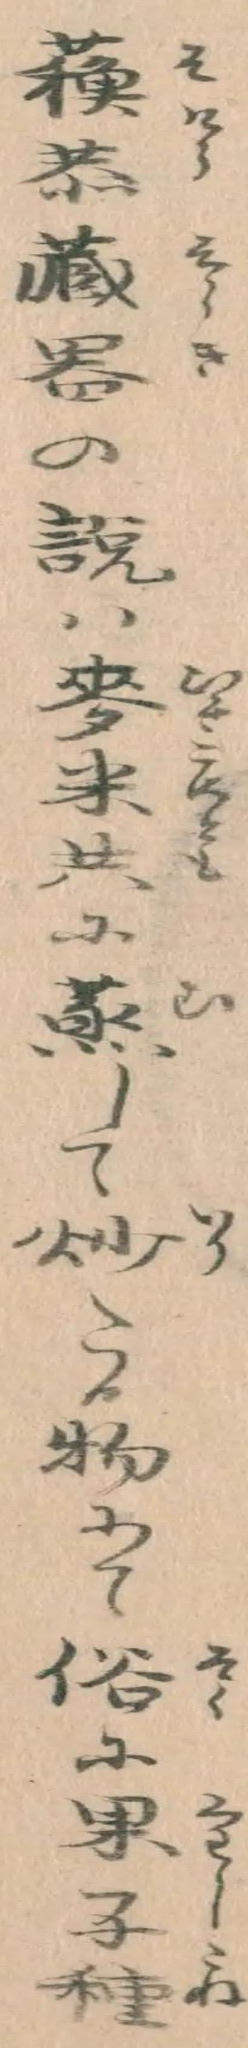蘇恭蔵器の説は麦米共に蒸して炒たる物にて俗に果子種
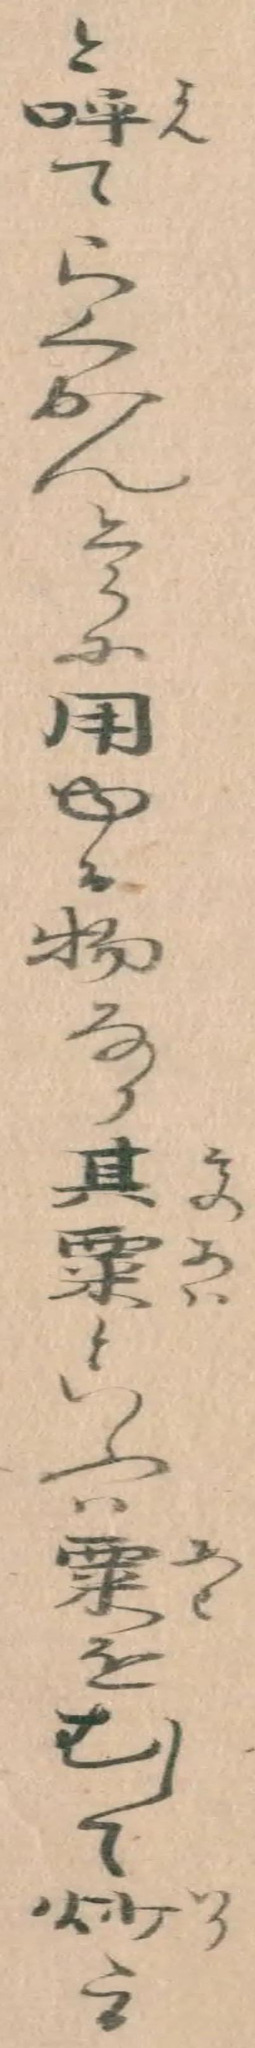と呼てらくかんとうに用ゆる物なり其粟といふは粟をむして炒たる
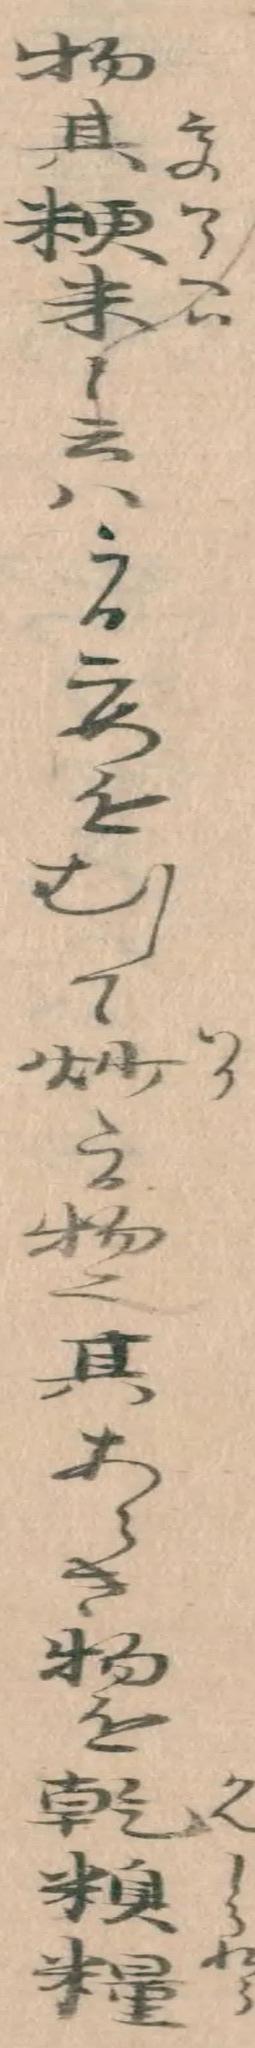物其粳米と云はうるこめをむして炒たる物也其あらき物を乾糗糧
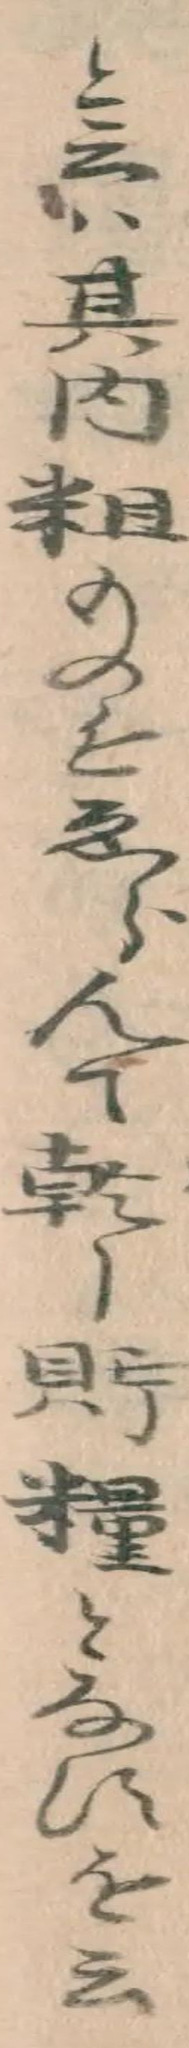と云は其内粗ものをゑらんて乾し貯糧となすを云
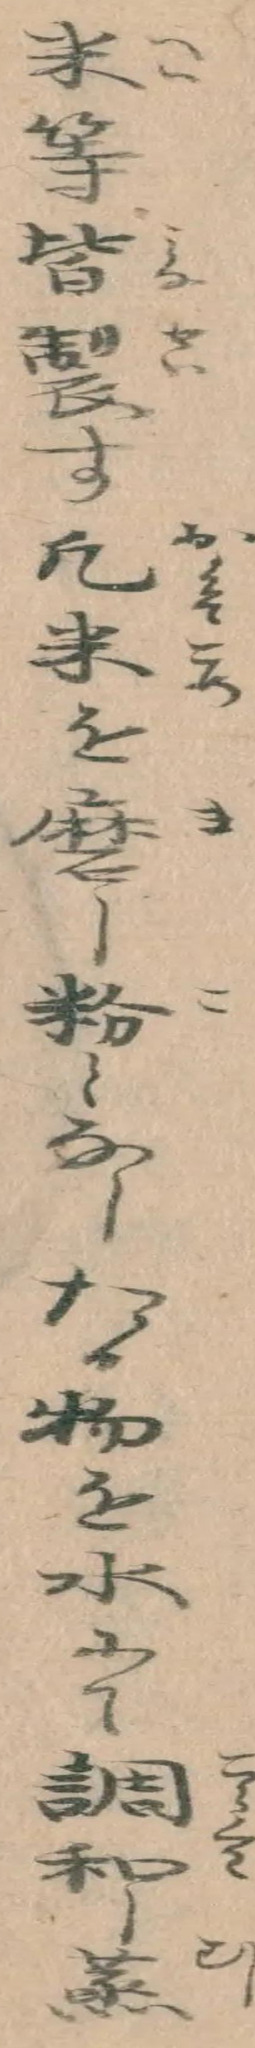米等皆製す凡米を磨し粉となしたる物を水にて調和し蒸
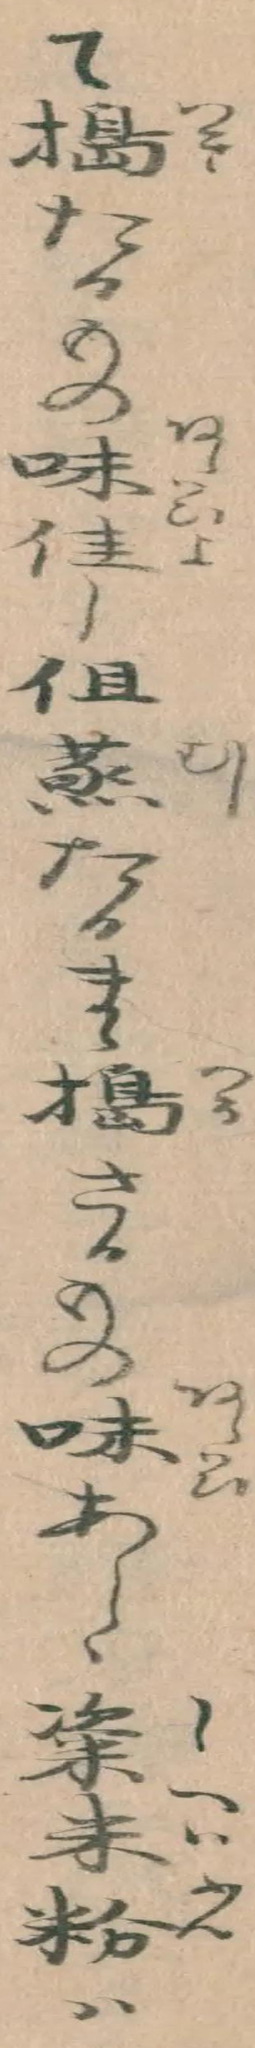て搗たるもの味佳し但蒸たるまゝ搗さるもの味あしく粢米粉は
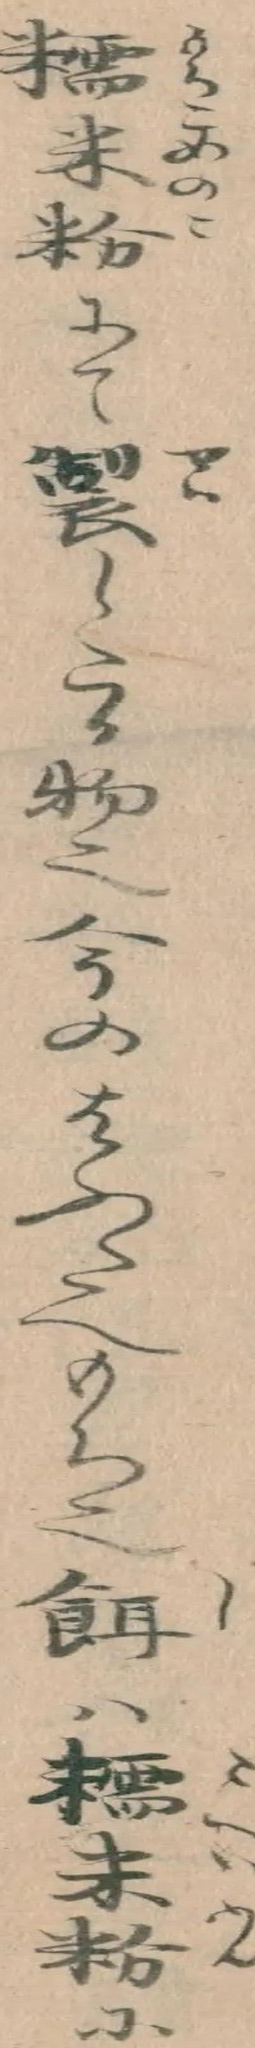糯米粉にて製したる物也今のはふたへもち也餌は糯米粉に
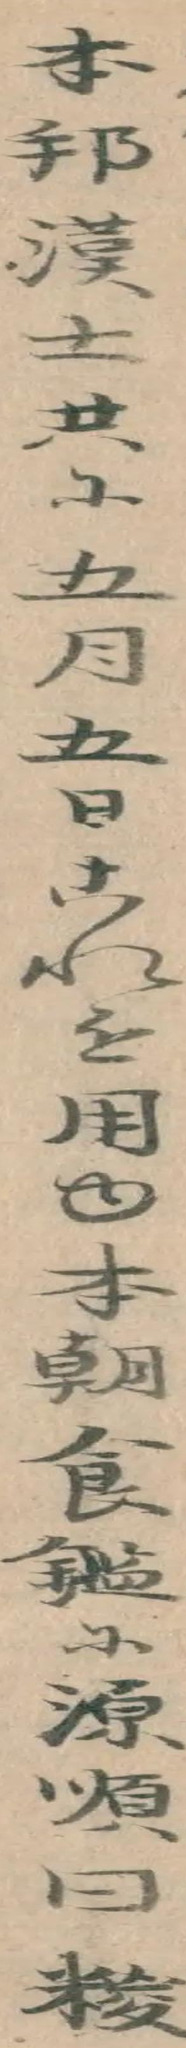本邦漢土共に五月五日これを用ゆ本朝食鑑に源順曰粽

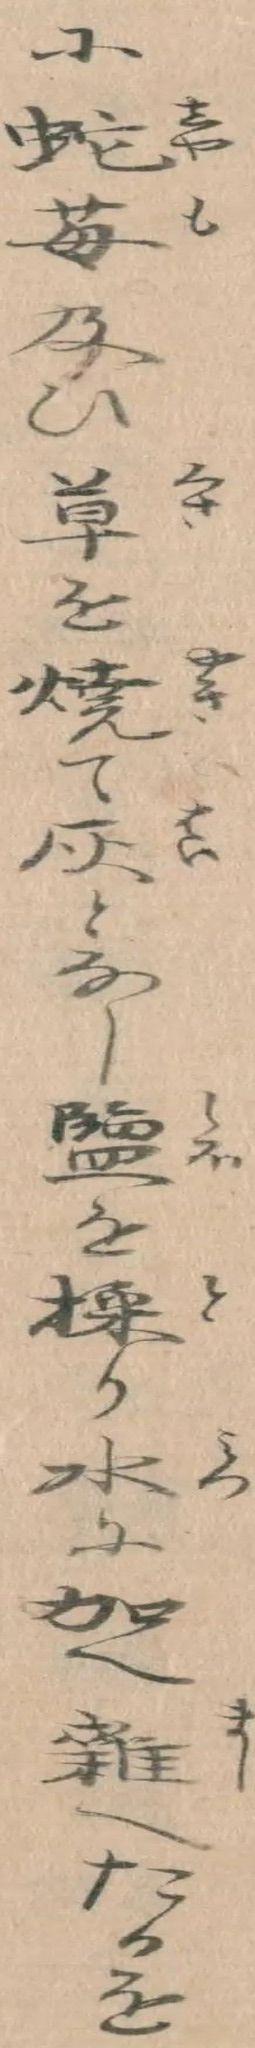に蛇苺及ひ草を焼て灰となし塩を採り水に加へ雑へたるを
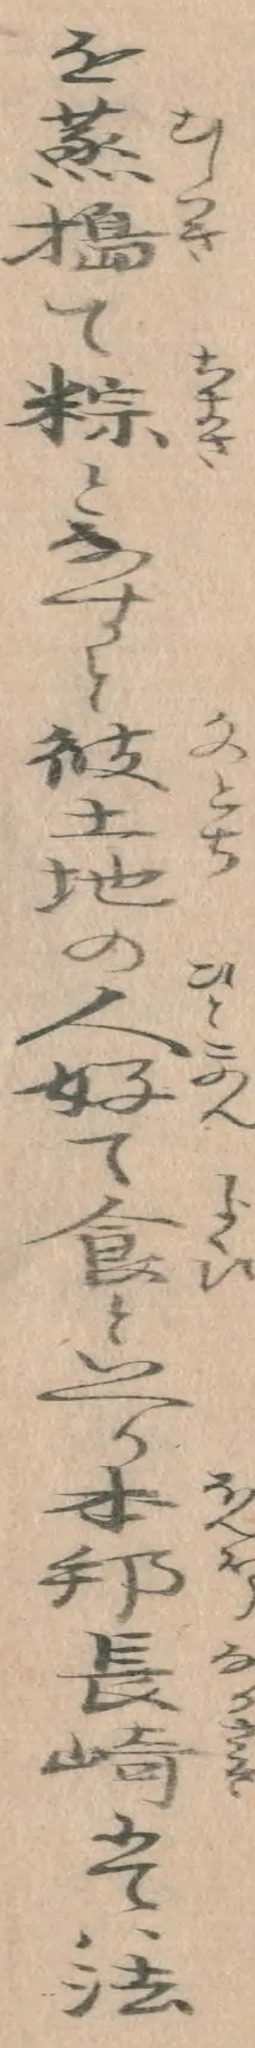を蒸搗て粽となすと彼土地の人好て食といへり本邦長崎にては法
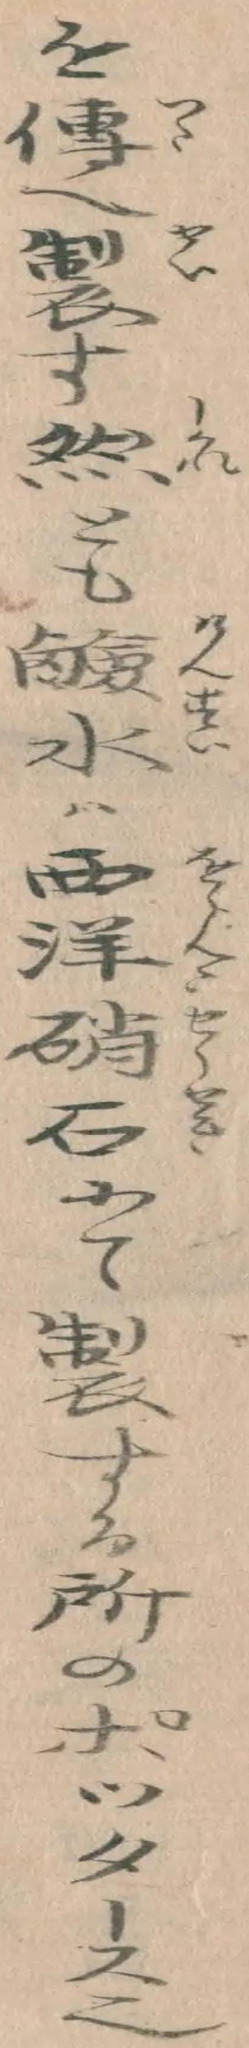を伝へ製す然とも鹸水は西洋硝石にて製する所のポッタース也
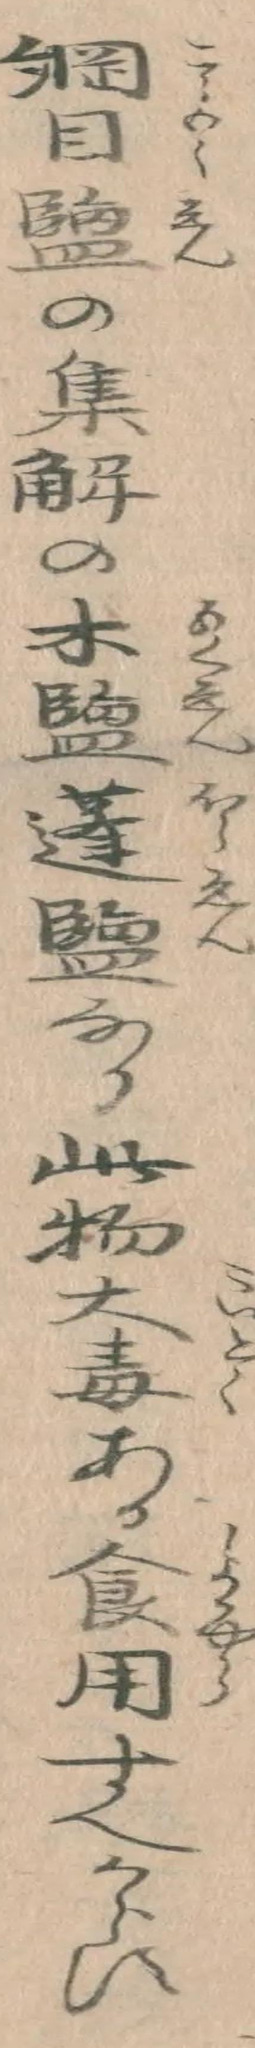綱目塩の集解の木塩蓬塩なり此物大毒ある食用すへからす
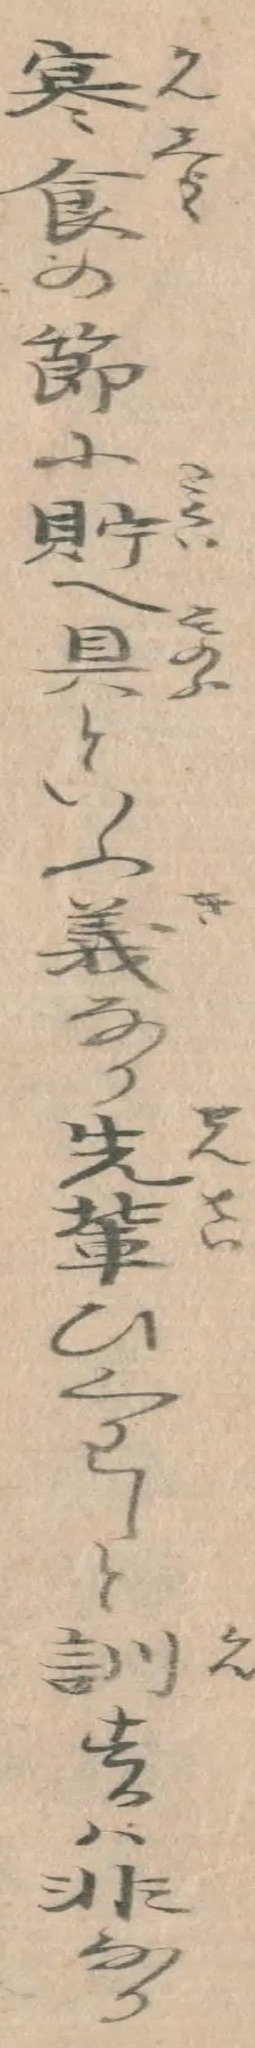寒食の節に貯へ具といふ義なり先輩ひくわしと訓するは非なり
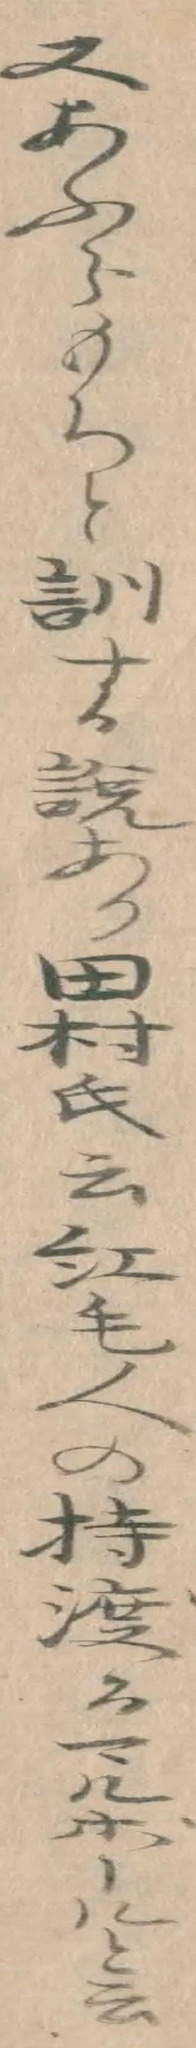又あふらもちと訓する説あり田村氏云紅毛人の持渡るマルボールと云
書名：本草図譜. 巻43-45
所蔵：国立国会図書館 National Diet Library, JAPAN
